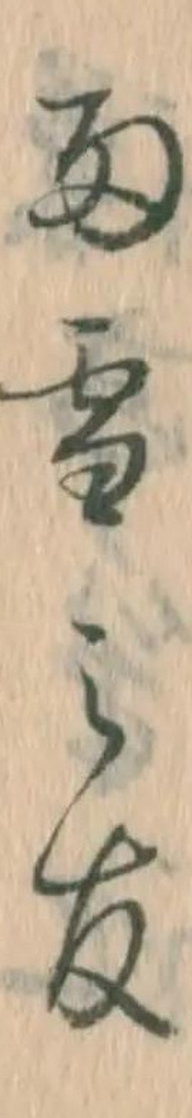雨雪之友
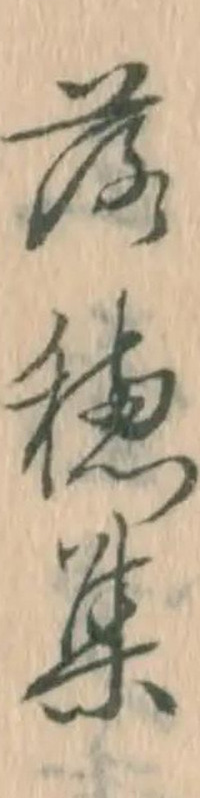落穂集
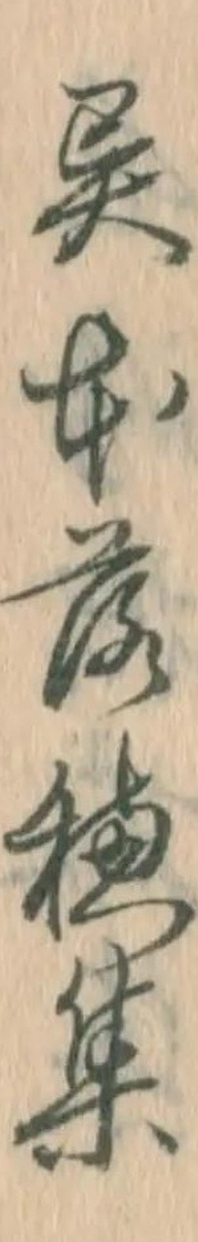異本落穂集
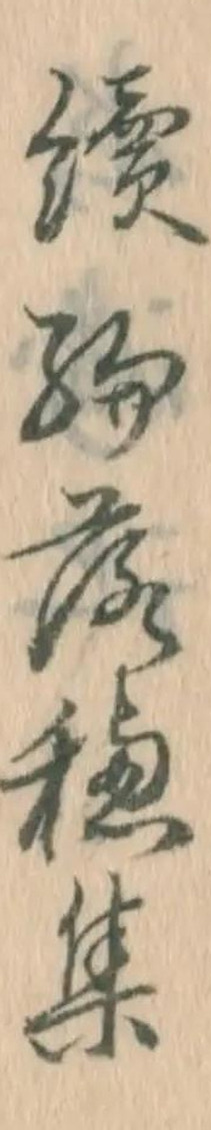続編落穂集

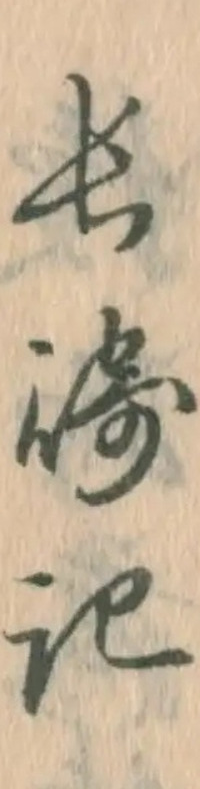長崎記
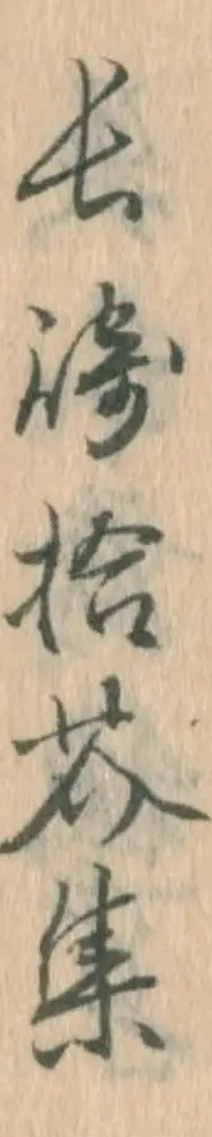長崎拾芥集
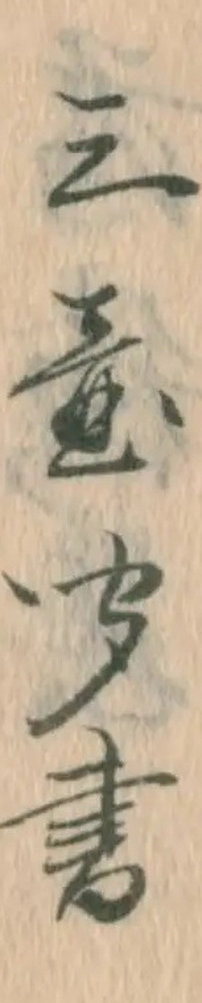三壺聞書
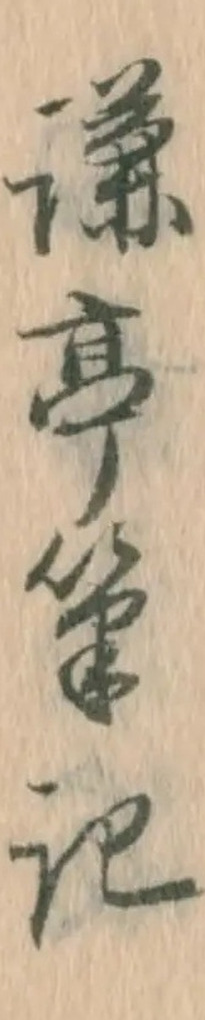謙亭筆記
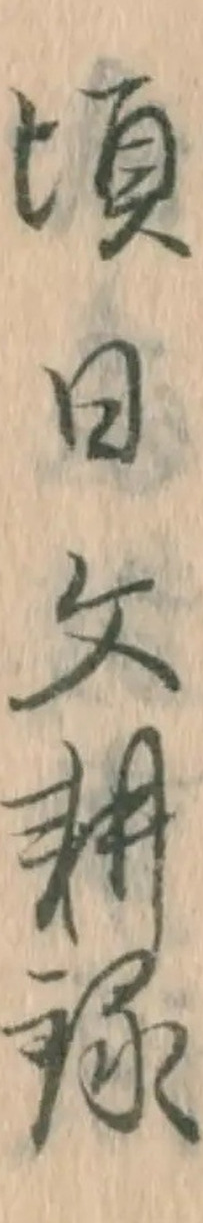頃日文耕録
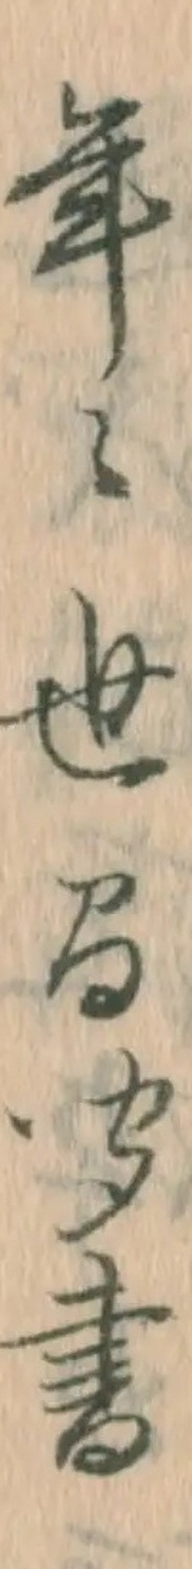年々世間聞書
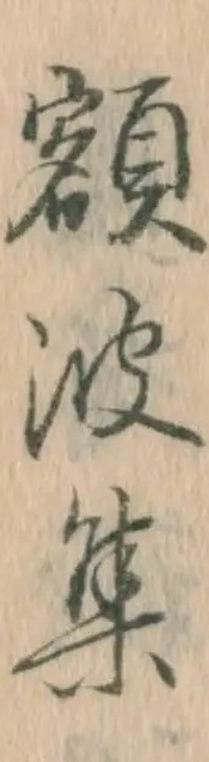額波集
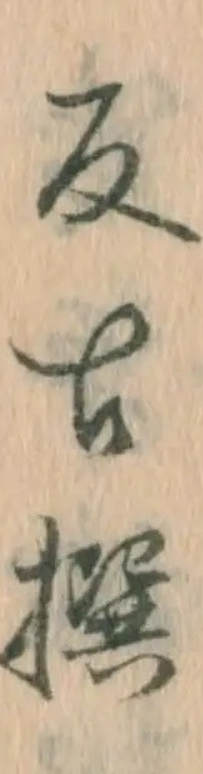反古撰
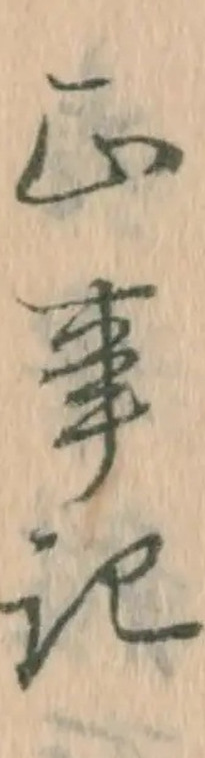正事記
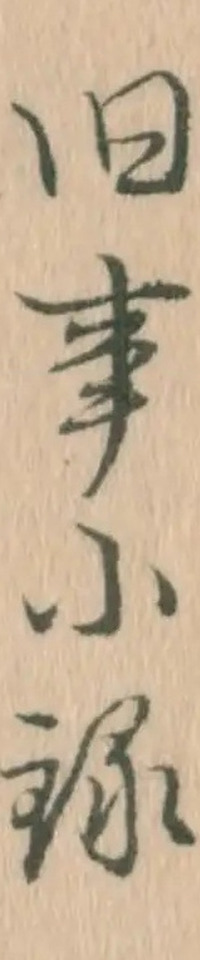旧事小録
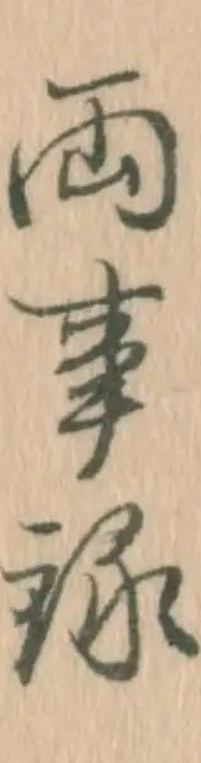両事録

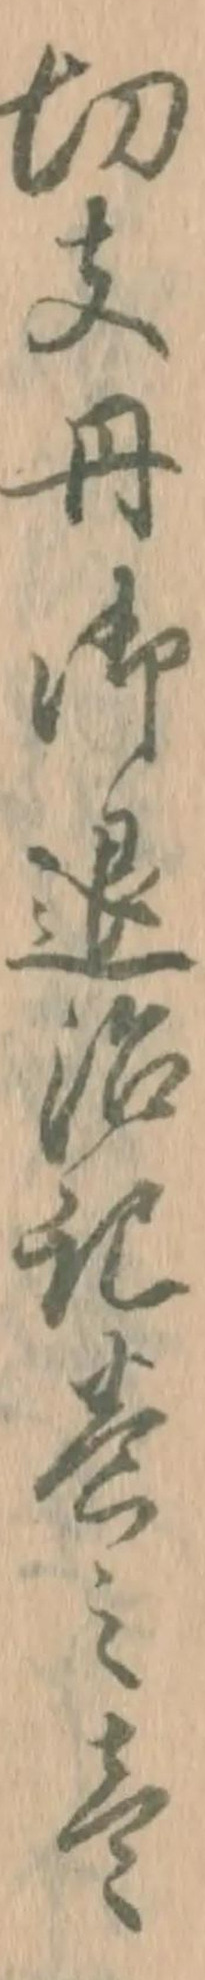切支丹御退治記巻之壱
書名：切支丹御退治記 49巻. [1]
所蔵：国立国会図書館 National Diet Library, JAPAN
